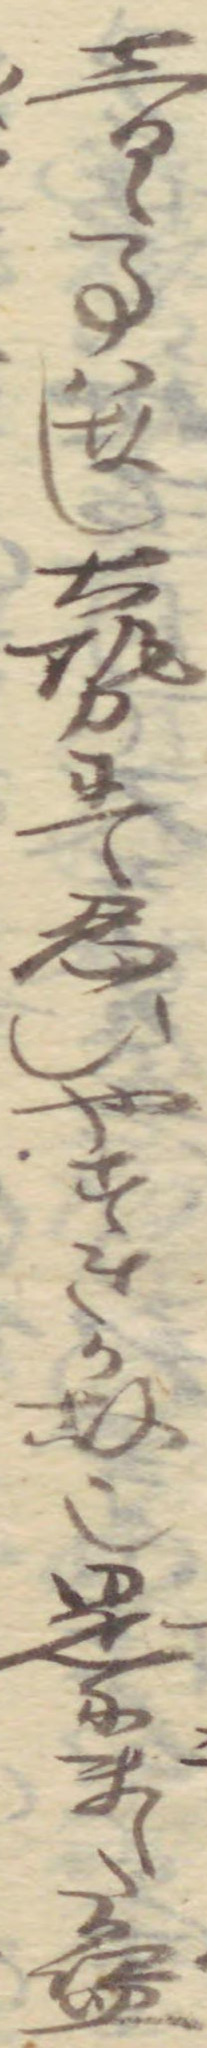しるゝ事はなし大勢にて忍ひやすきか故也是にましたる盗
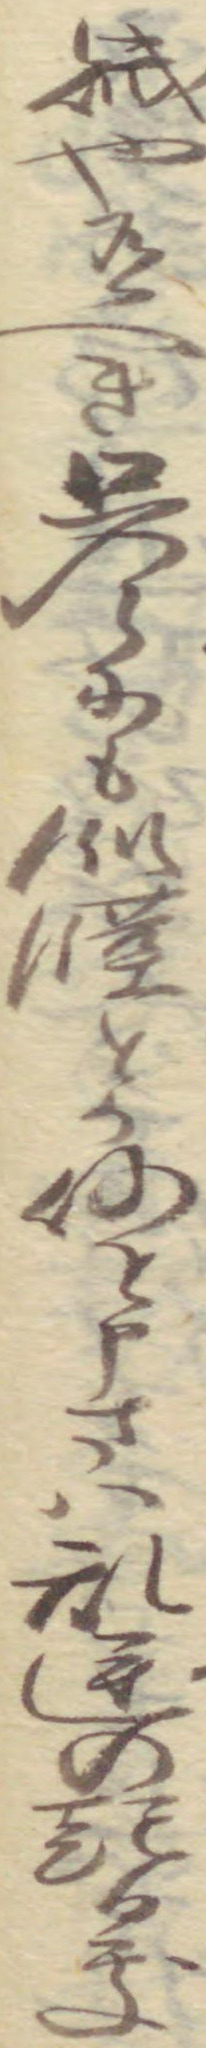賊や有へき只今にも飢饉とか何そ申さは乱逆の起る処
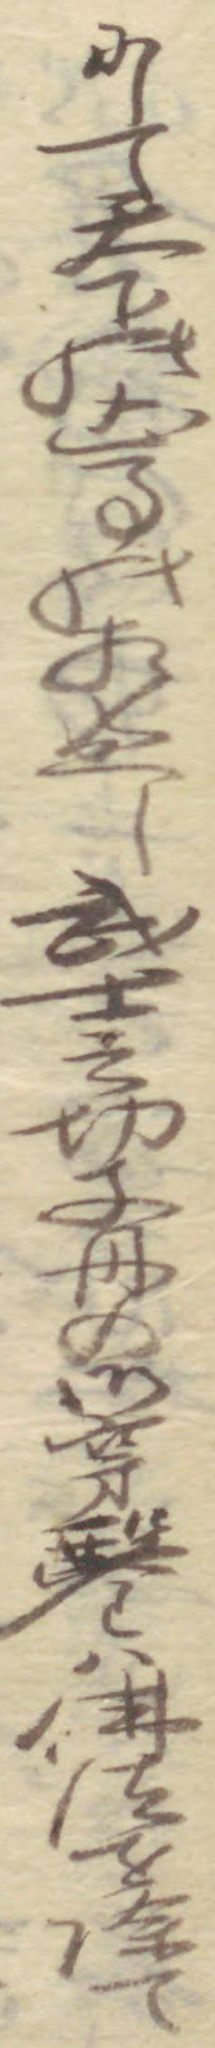にして天下の凶事の相成へし武士云切支丹の御穿鑿は仏法を除て
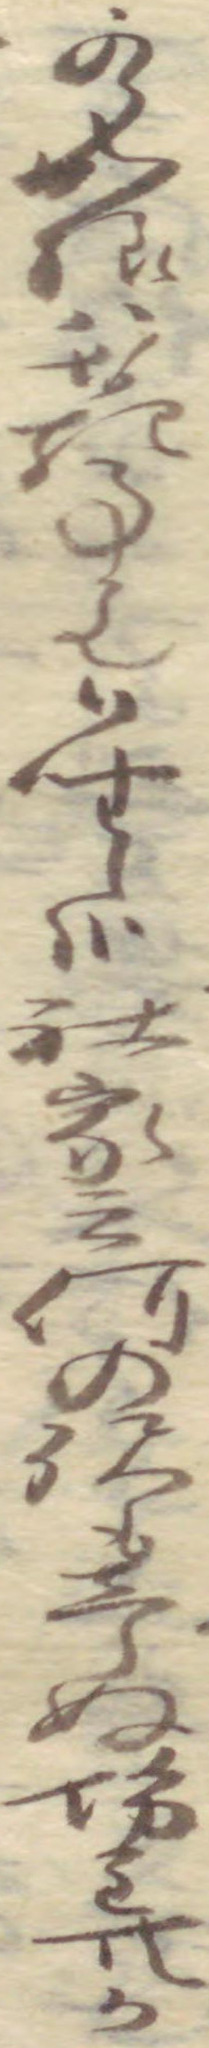可被成様はなき事ニて御座候哉社家云何の訳もしらぬ坊主共か
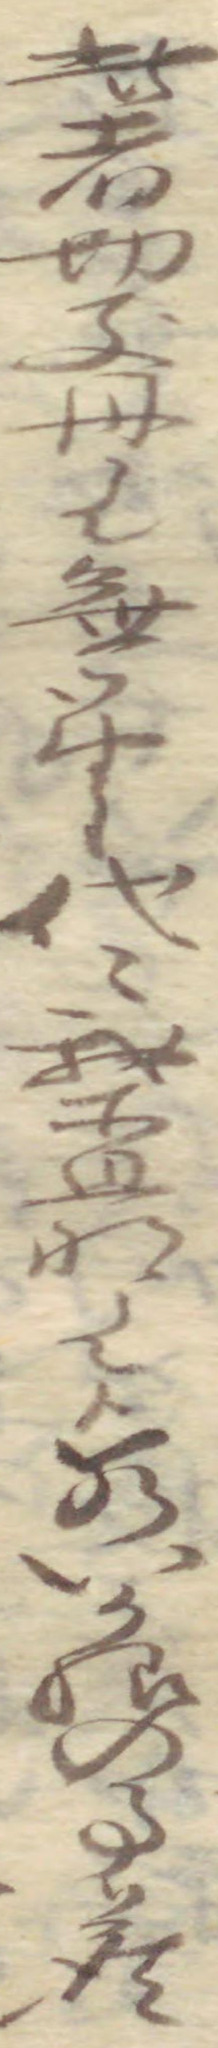此者切支丹ニて無御座候代〻我等旦那ニて候若いか様の事御座候
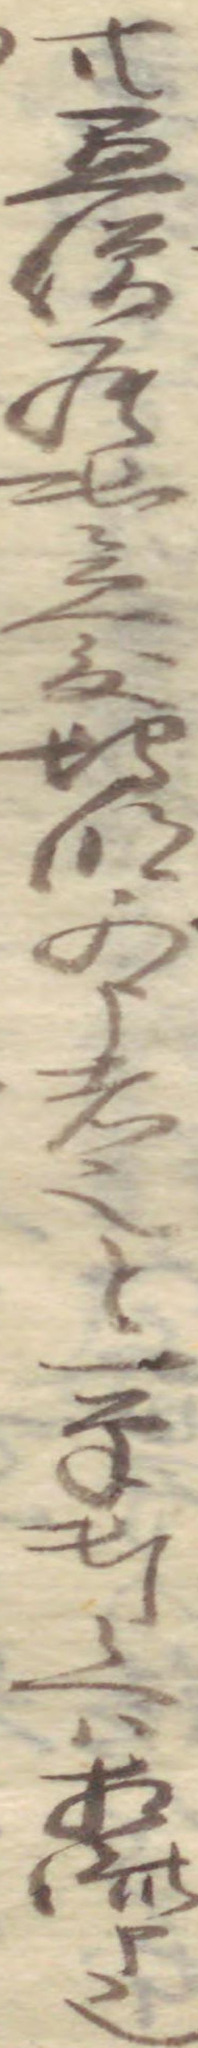共愚僧罷出急度埒明可申者也と一筆出し候へは相済申也
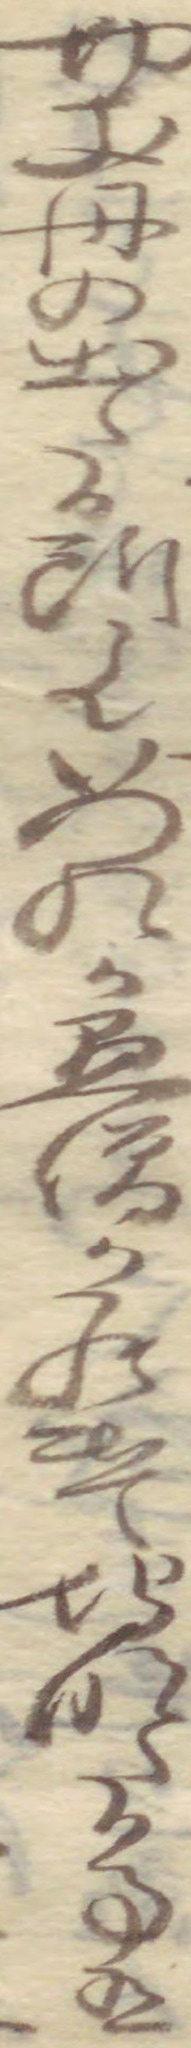切支丹の出たる所ニていつれか愚僧か罷出て埒明たる事有
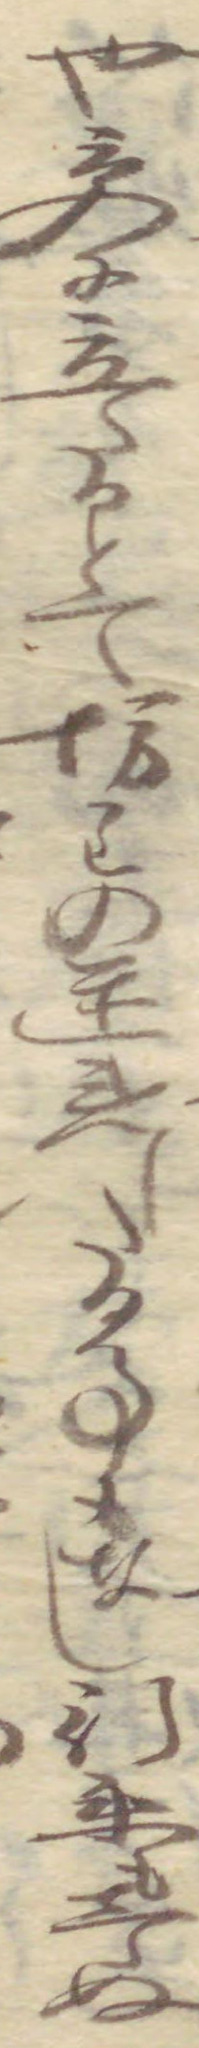や受に立たるとて坊主の迷惑したる事もなし行衛もしらぬ
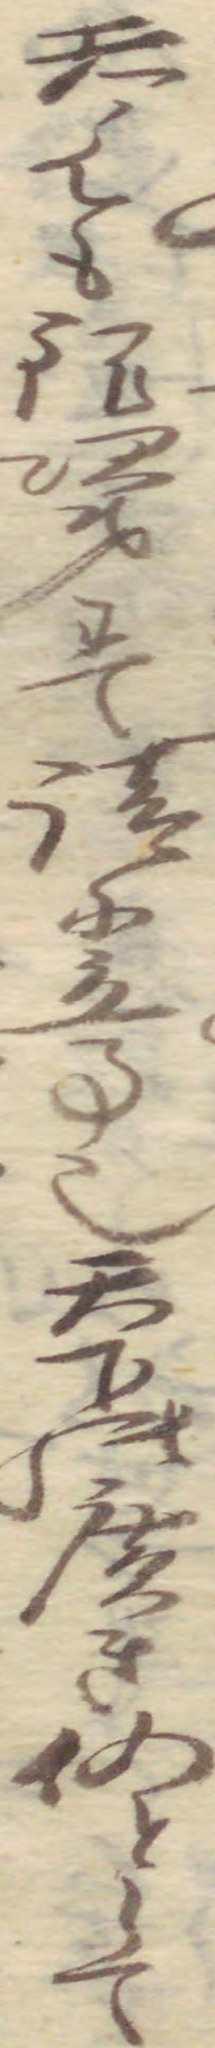者ニても銀次第にて請に立事也天下の広き何として
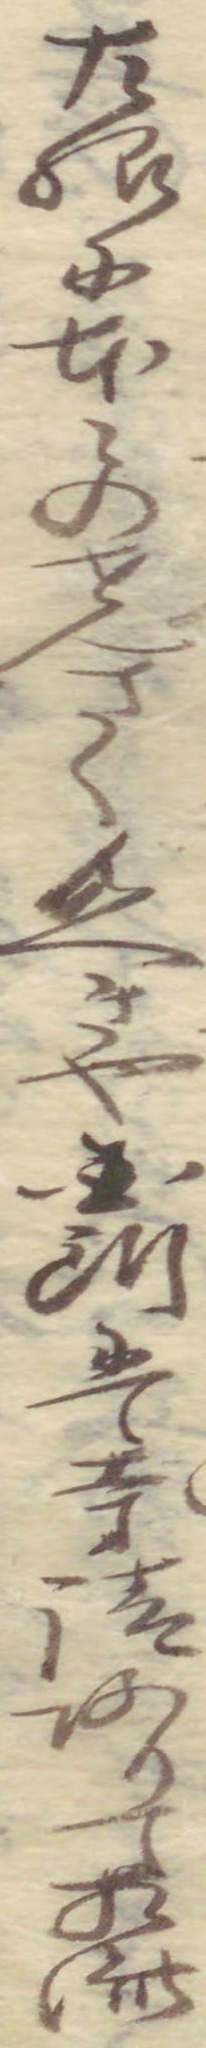左様に本〻のせんさく成へきや国所にて寺請ありて相済
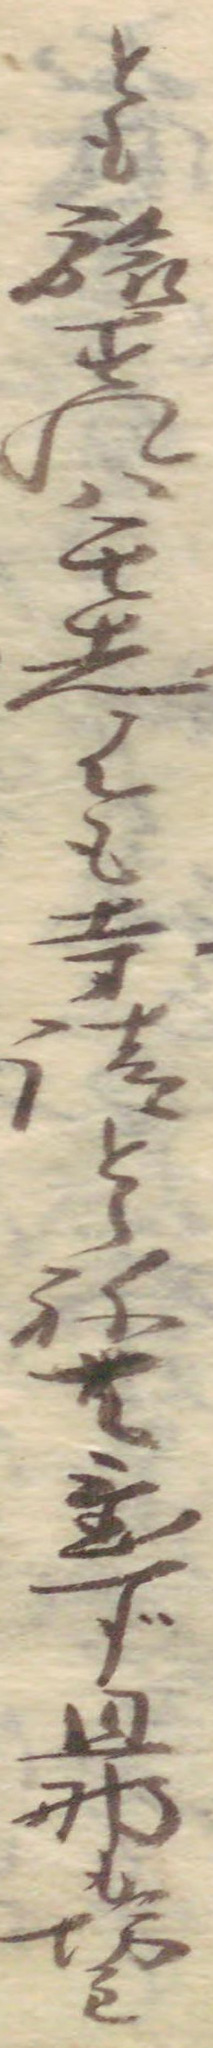とも旅すれは其先ニても寺請とらねは置ず旦那も坊主
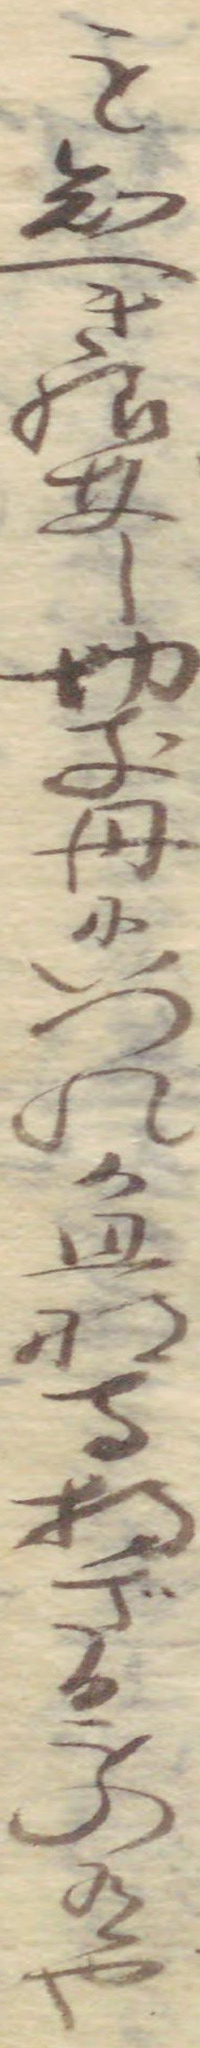も知へき様なし切支丹にいつれか旦那寺持ざるもの有や
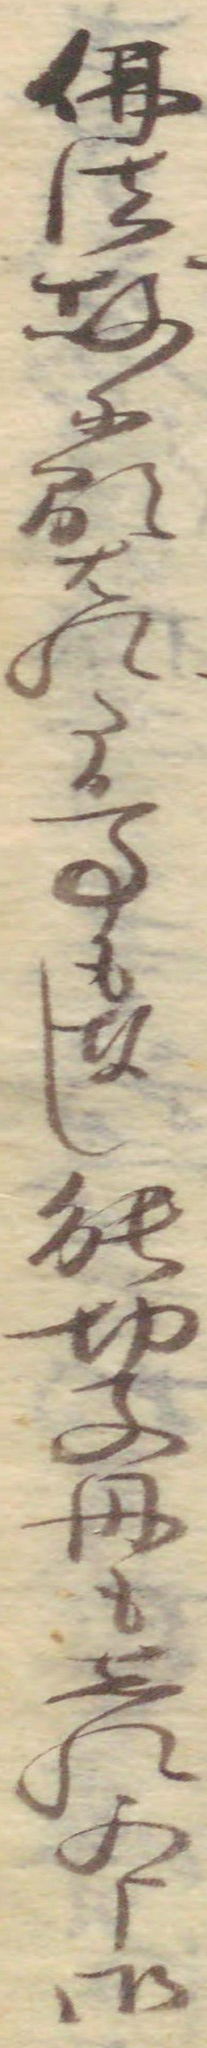仏法故に顕はれたる事もなし能切支丹もしれ可申御

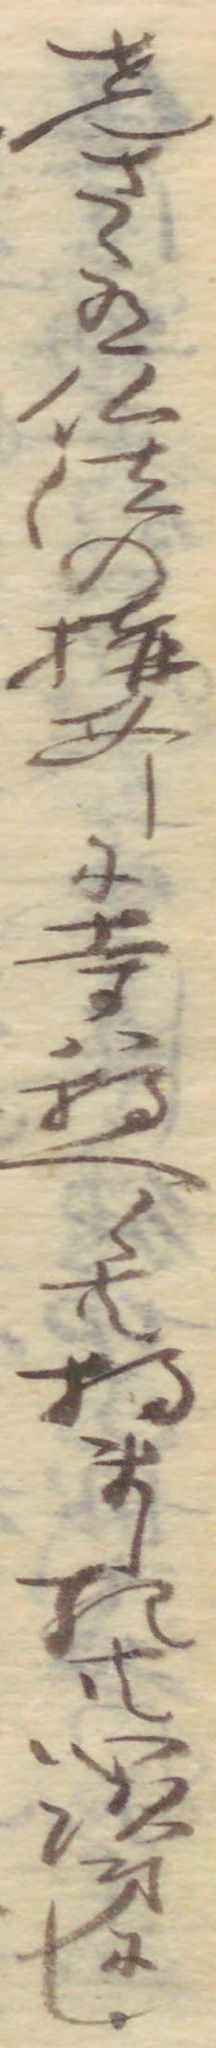せんさく有仏法の構なしに寺は持へく共持ましき共心次第にし
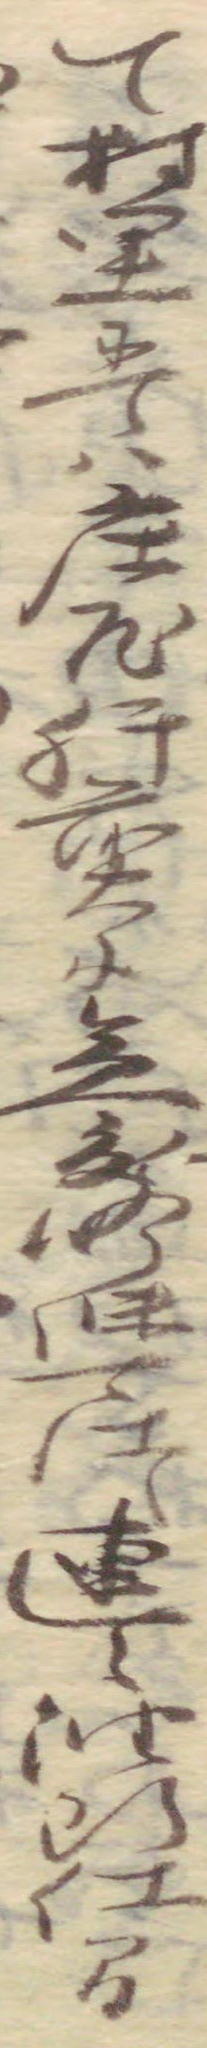て村里にては庄屋肝煎に急度吟味可仕候連〻油断仕間
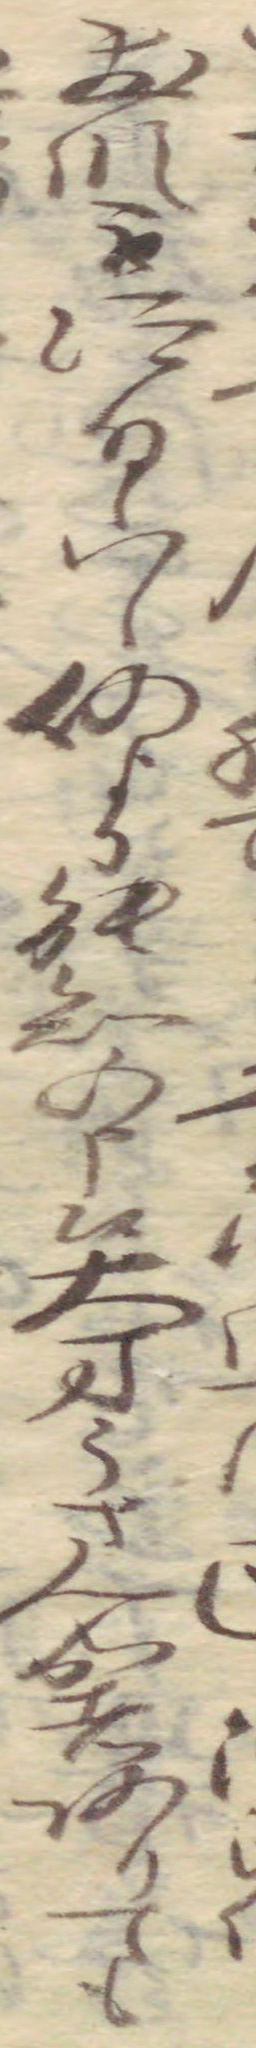敷段被仰付候はゝ何より能知可申候大方うさん成者ありても
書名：鶯宿雑記. 巻263-264
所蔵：国立国会図書館 National Diet Library, JAPAN
